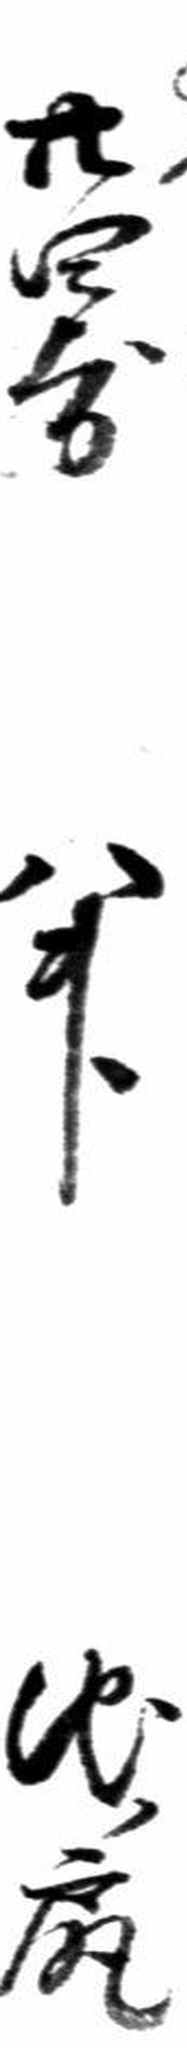廿四歩八升池ノ尻
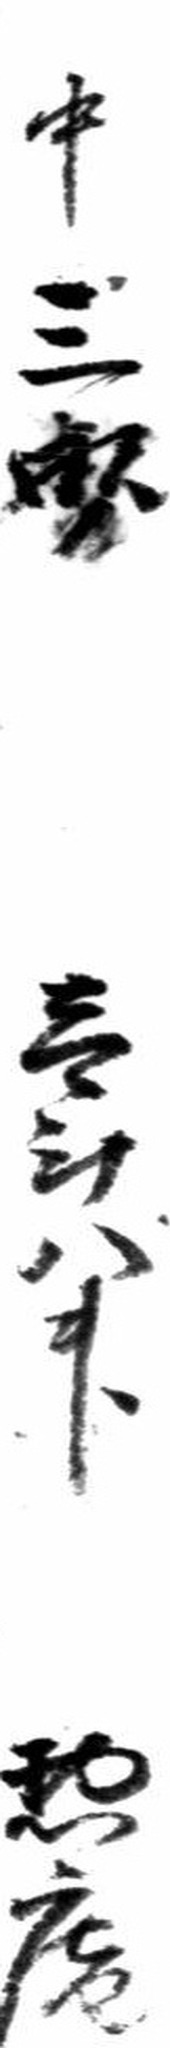中三畝壱斗八升惣庵
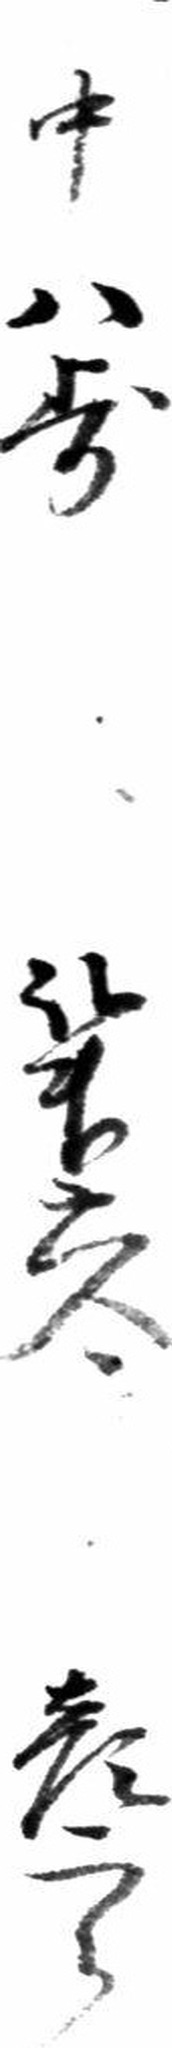中八歩弐升六合彦二郎
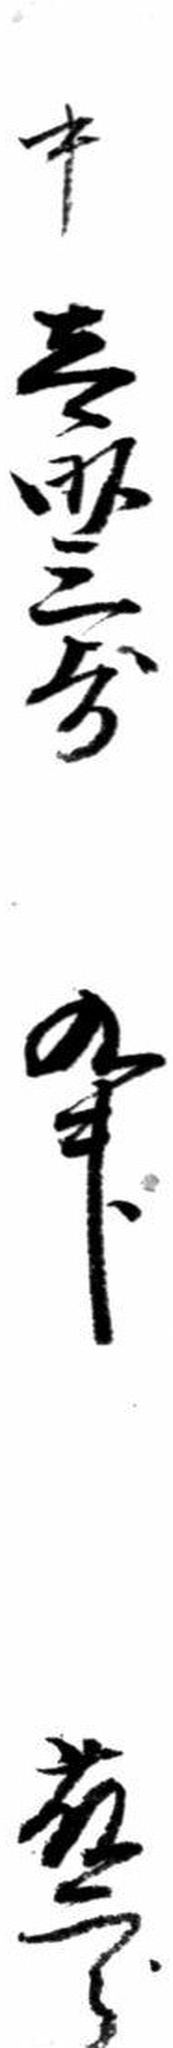中壱畝三歩九升藤二郎
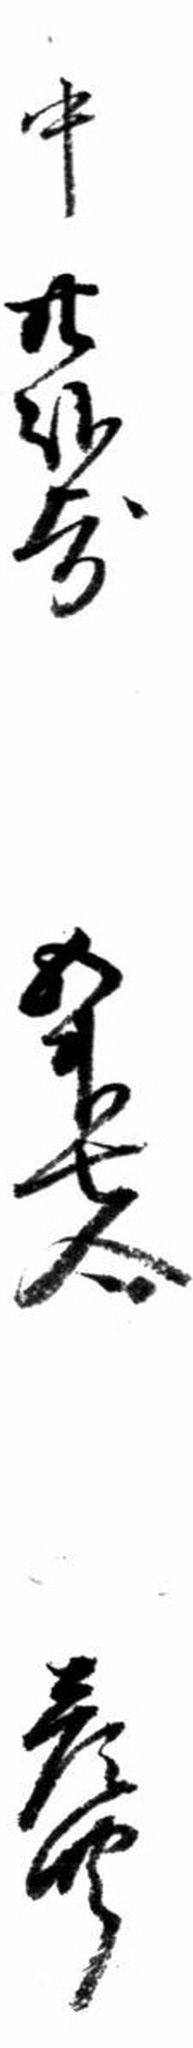中廿弐歩五升七合彦四郎
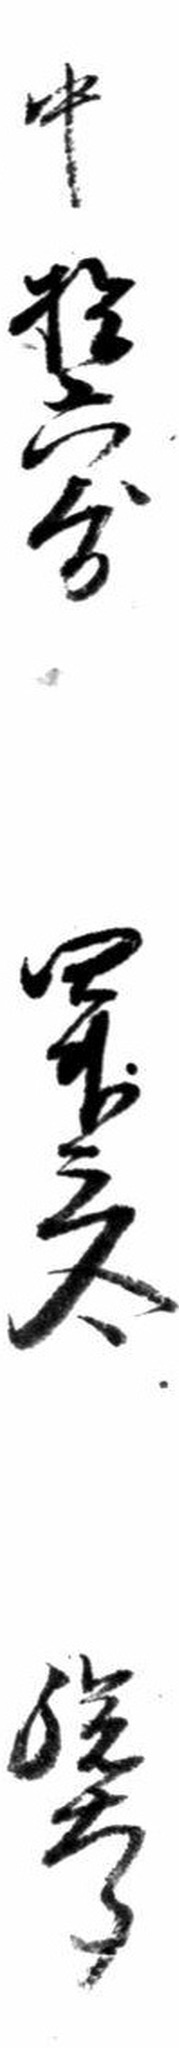中拾六歩四升三合孫大郎
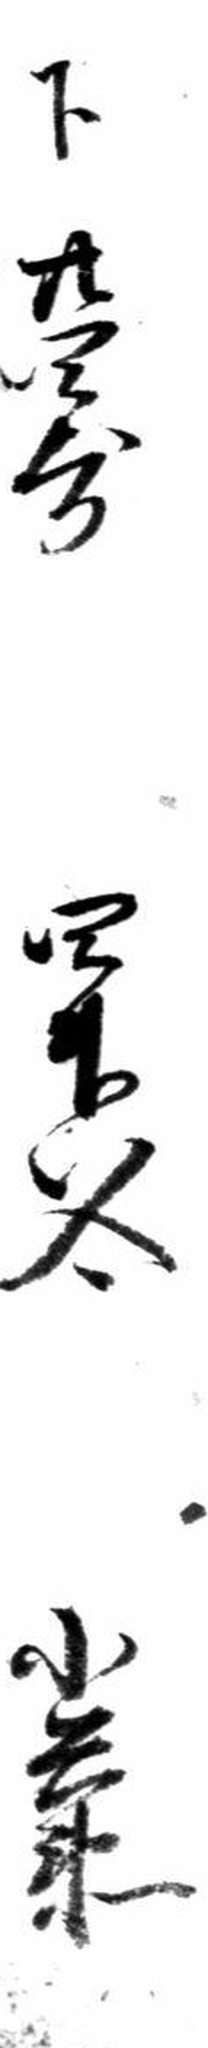下廿四歩四升八合小兵衛
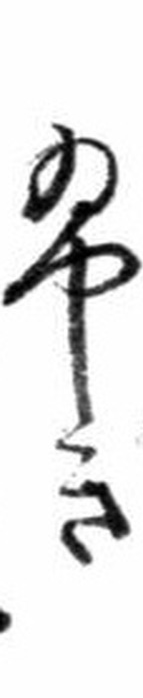ゐやしき

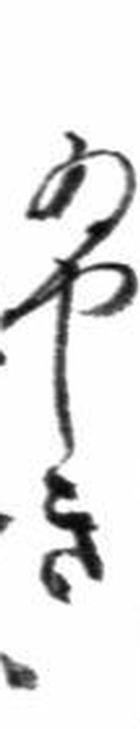ゐやしき
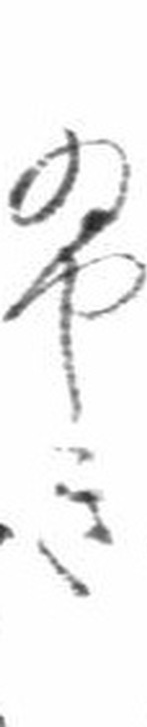ゐやしき
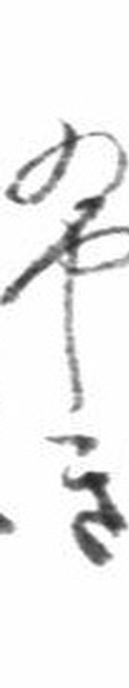ゐやしき
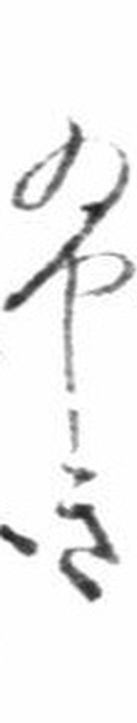ゐやしき
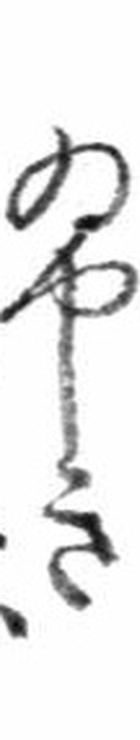ゐやしき
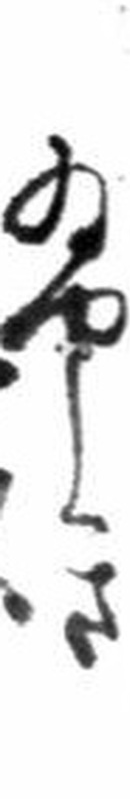ゐやしき
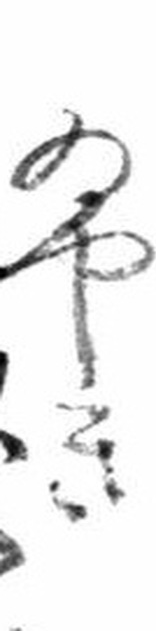ゐやしき
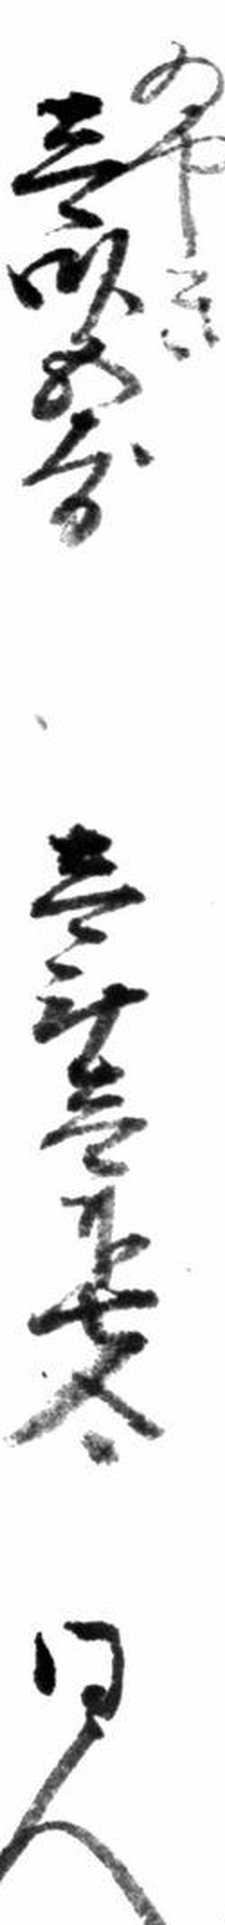壱畝五歩壱斗壱升七合同人
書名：若州三方郡之内世久見浦御検地帳（世久見浦検地帳写）
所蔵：福井県文書館 Fukui Prefectural Archives
